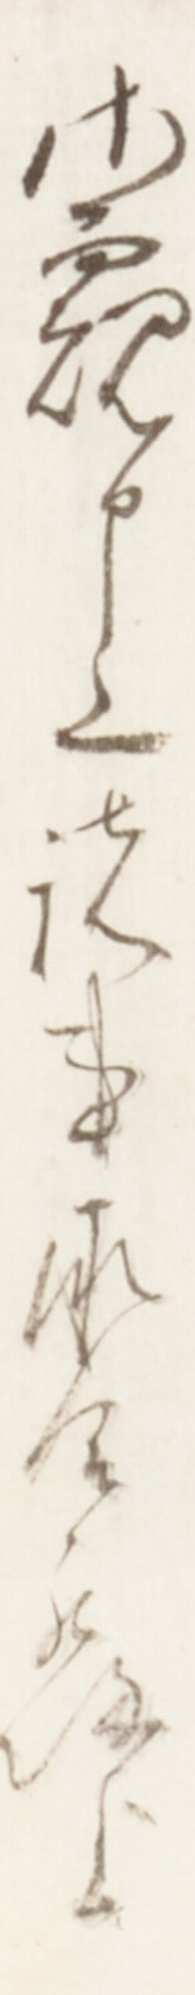御窺申上諸事承合罷帰申候
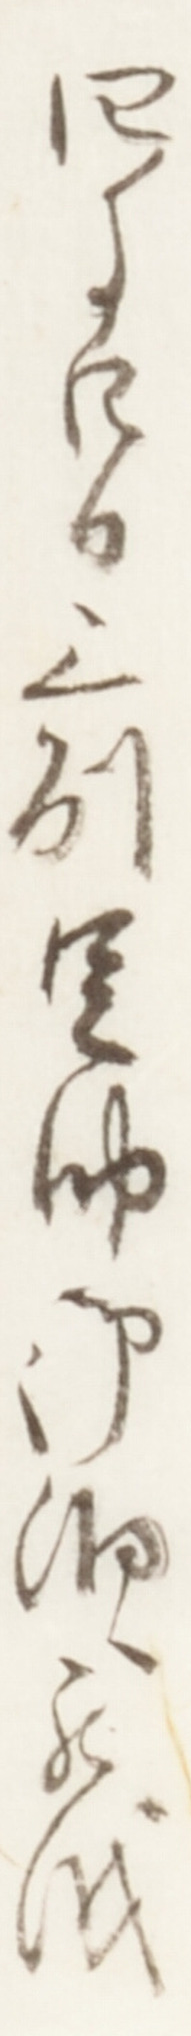四月四日三州御勤御泊江へ罷越
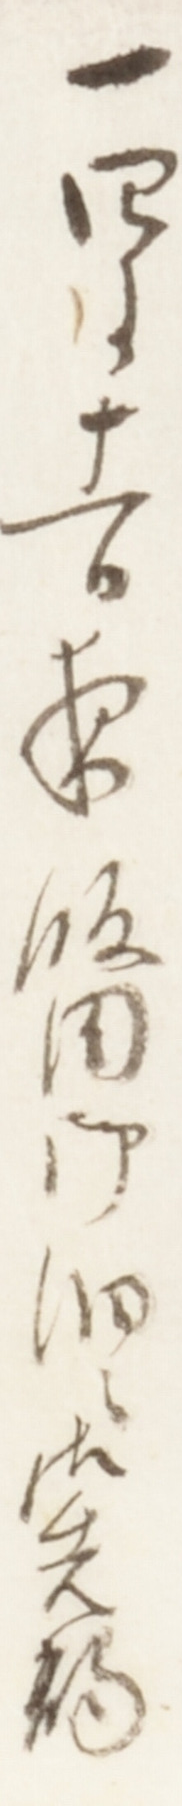一四月十一日夜飯田御泊之御先触
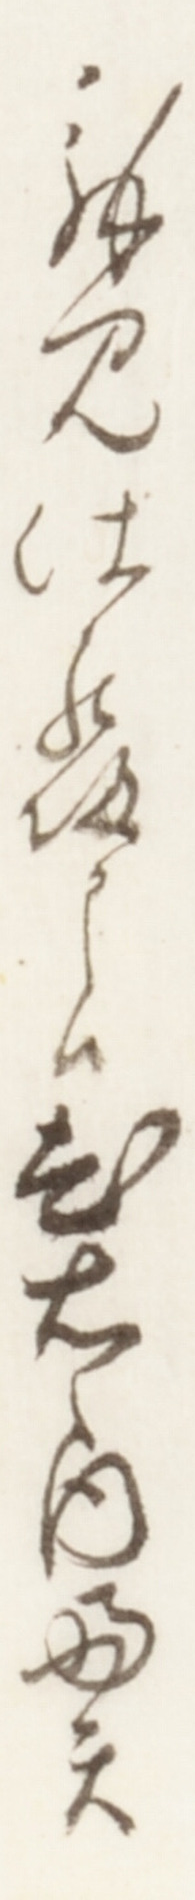拝見仕罷帰り申候尤右之内雨天
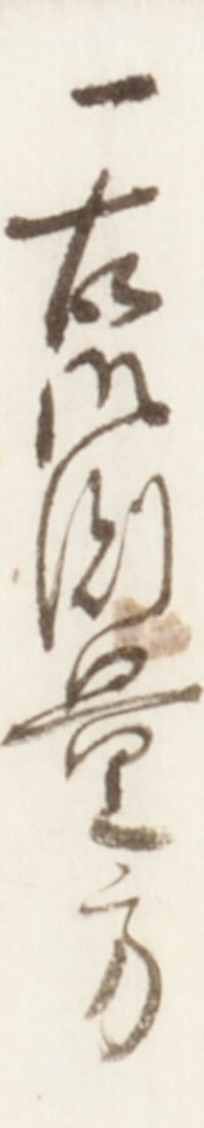一右御測量方
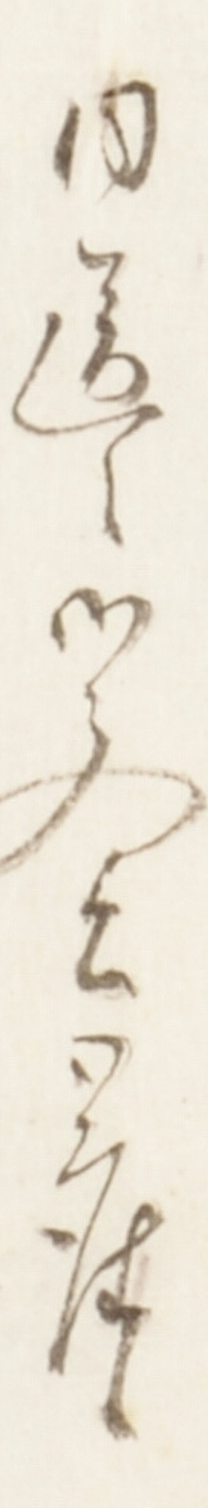日送之御文言御座候
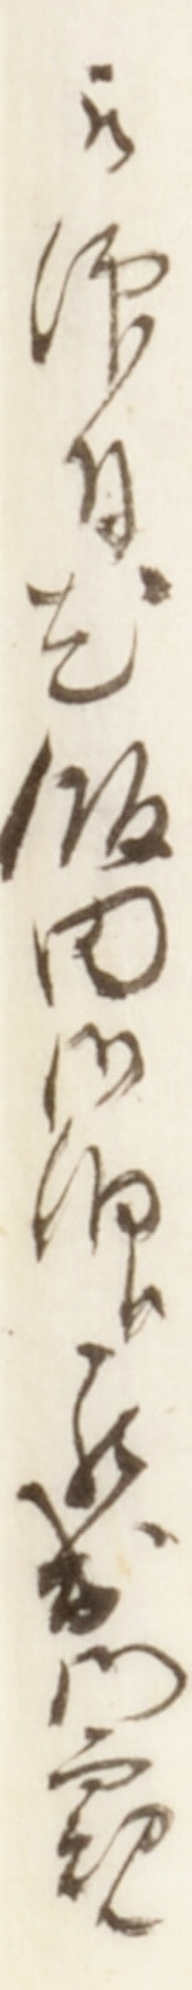被仰付尤飯田御泊江罷出御窺
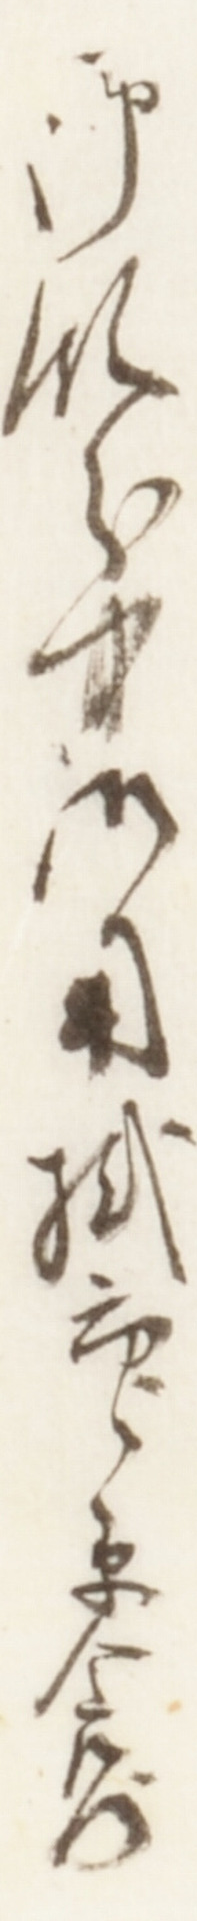御領分中御用掛市郎兵衛金左衛門
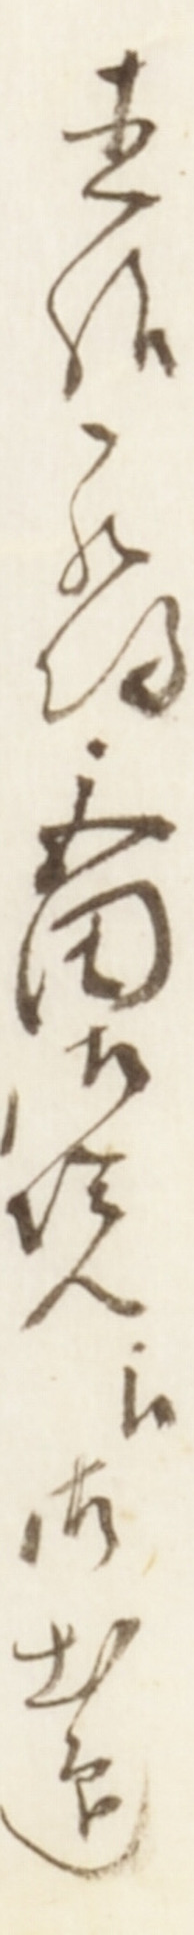直様罷帰宮田御境江御出迎
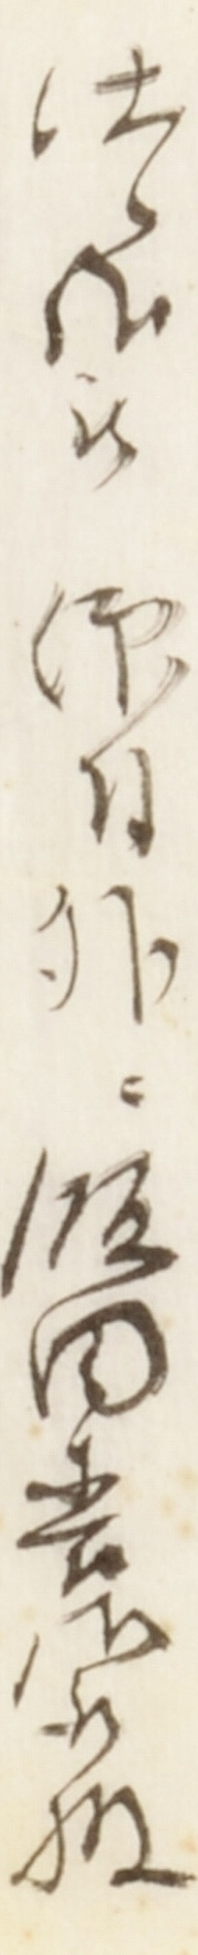仕候様被仰付外ニ飯田表御取扱
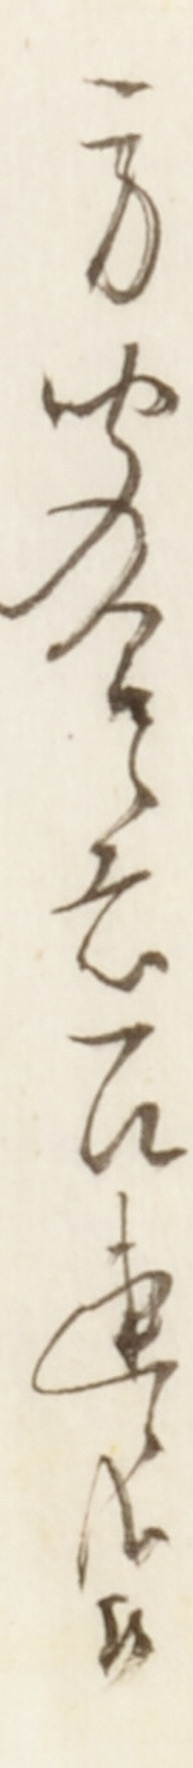方聞合之者召連候様被
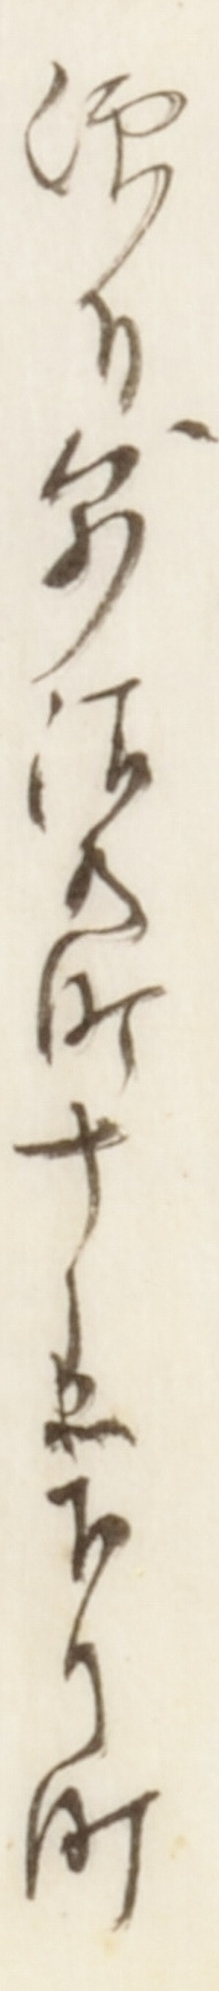仰付則清水町十兵衛下り町
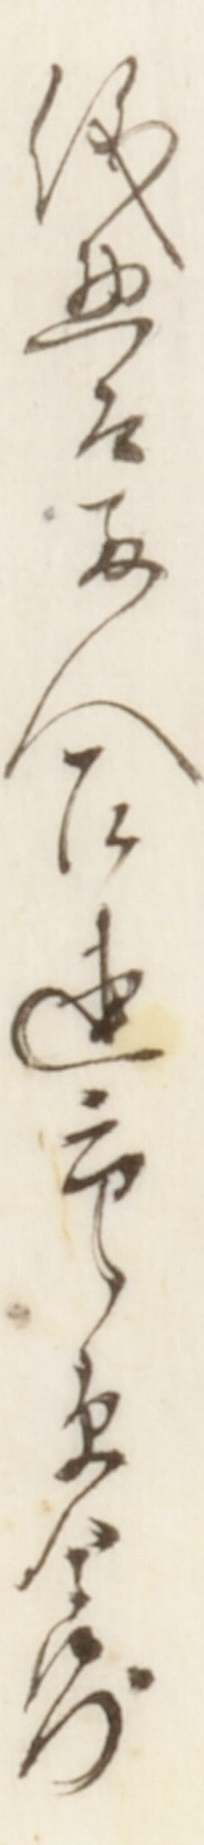儀惣太両人召連市郎兵衛金左衛門
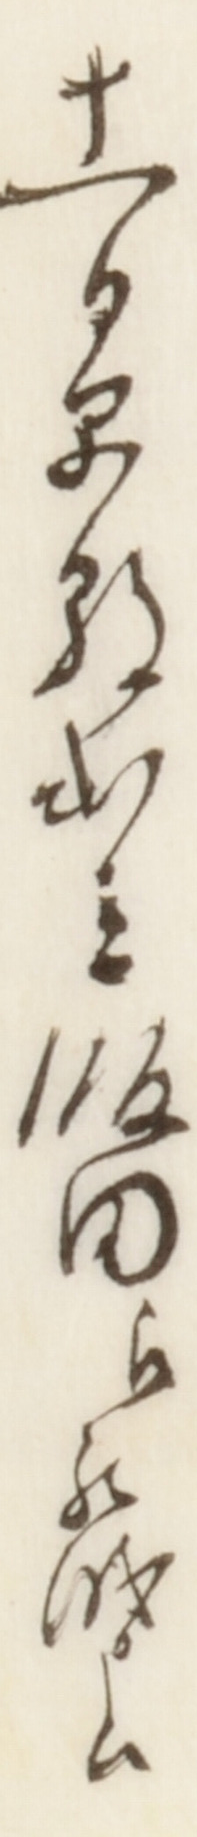十一日早朝出立飯田江罷越申候
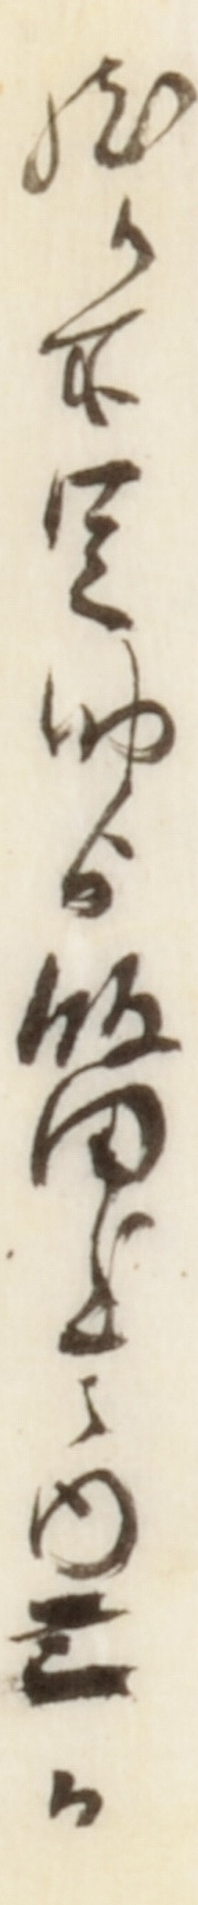然ル所足助より飯田迄之内三日
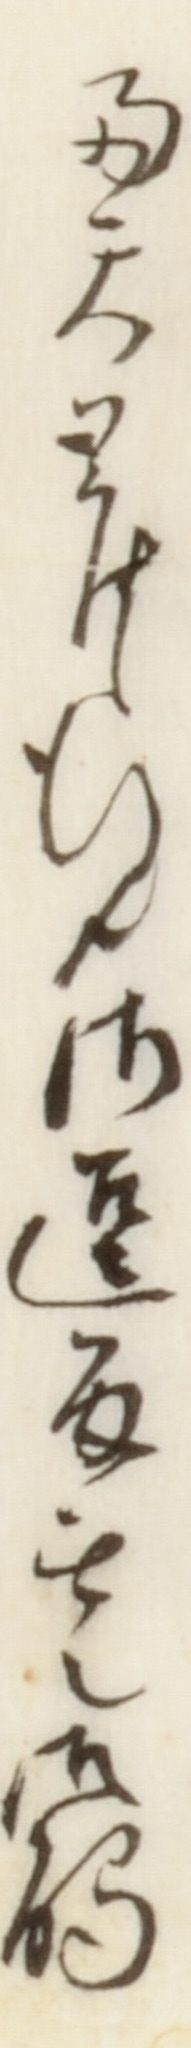雨天御座候得共御逗留無之御触
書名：御測量諸事控
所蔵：伊那市立高遠町図書館・合同会社AMANE
